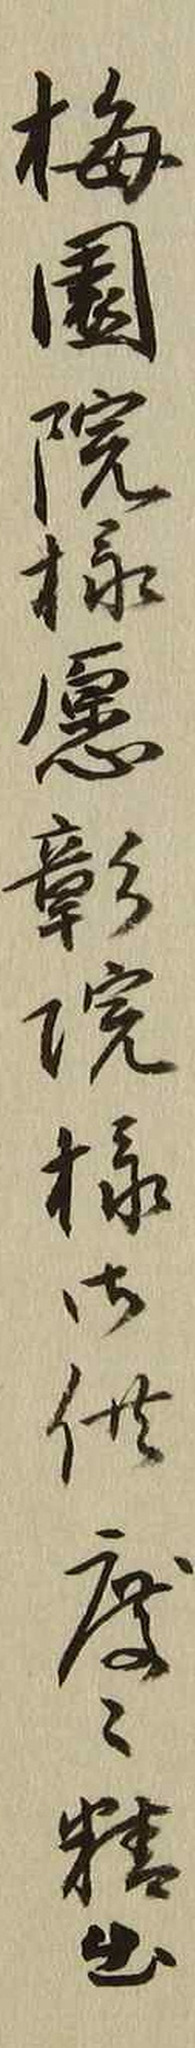梅園院様愿彰院様御供度々精出
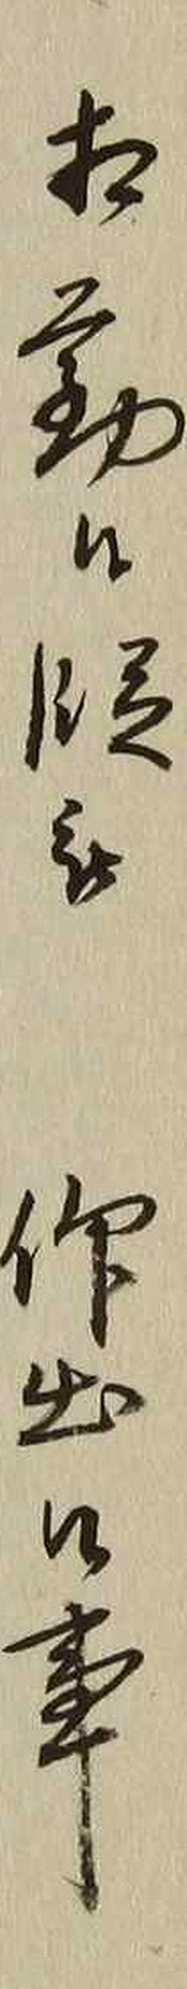相勤候段被仰出候事
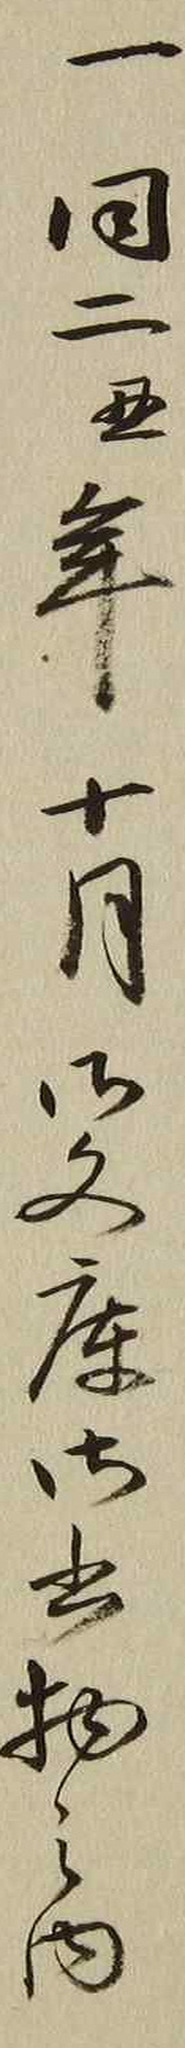一同二丑年十月御文庫御書物之内
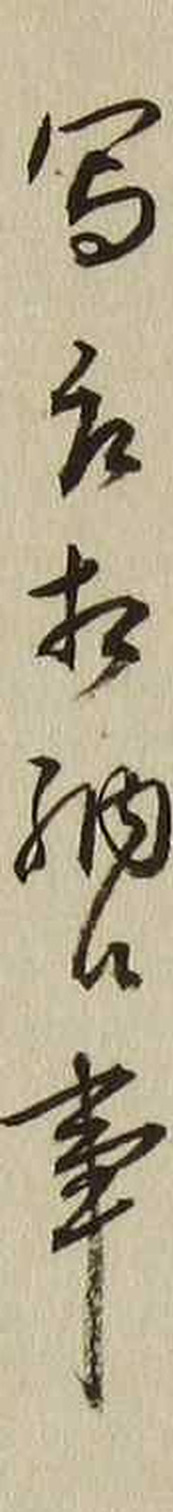写取相納候事
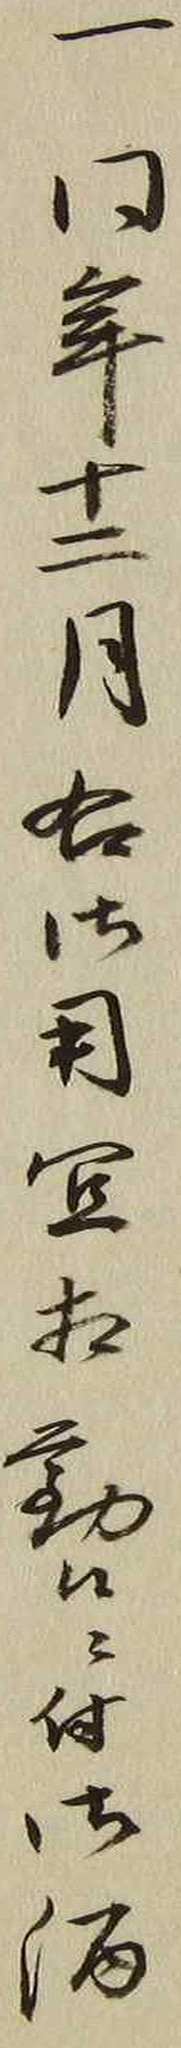一同年十二月右御用宜相勤候ニ付御酒
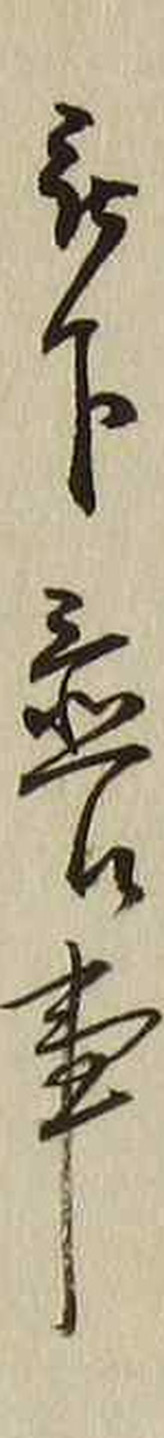被下置候事
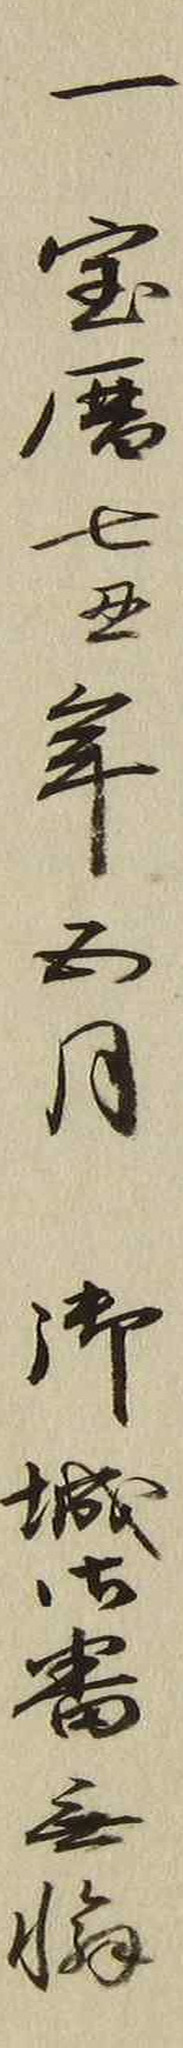一宝暦七丑年五月御城御番無懈
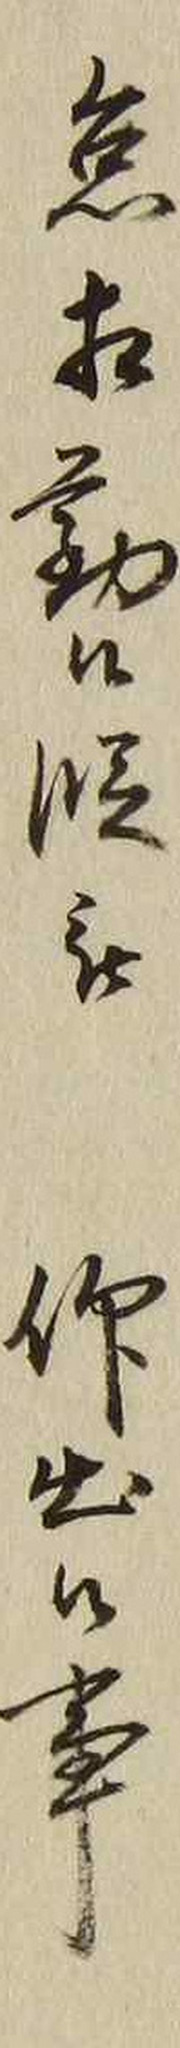怠相勤候段被仰出候事
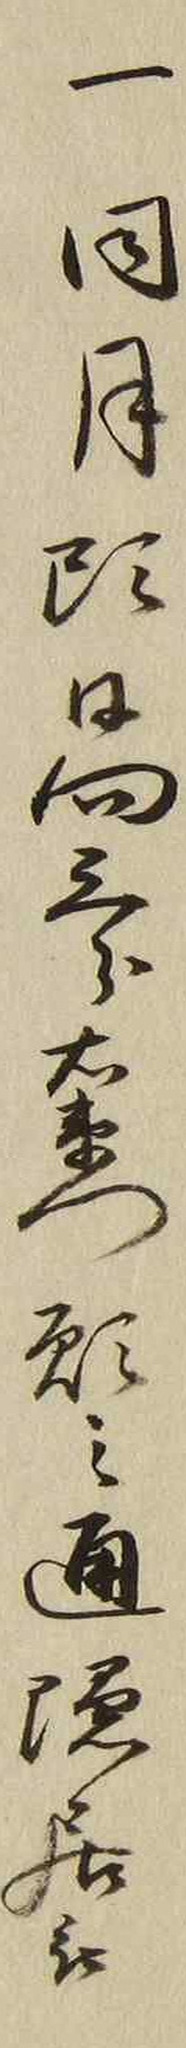一同月頭日向三郎右衛門願之通隠居被
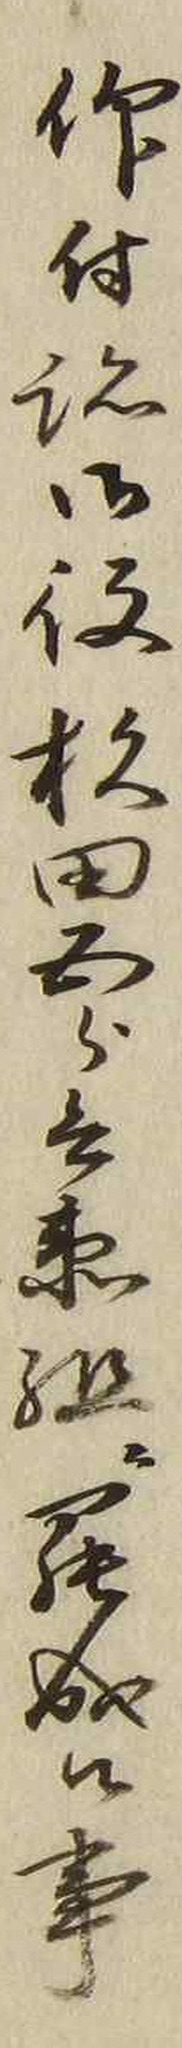仰付跡御役杉田五郎兵衛組ニ罷成候事

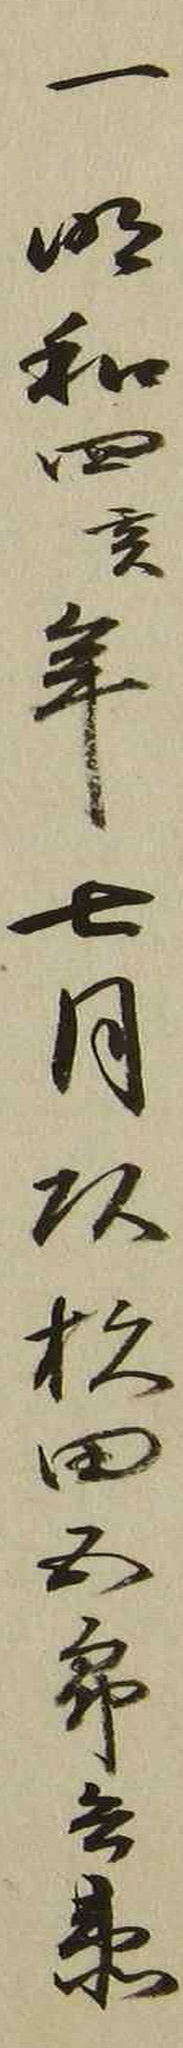一明和四亥年七月頭杉田五郎兵衛
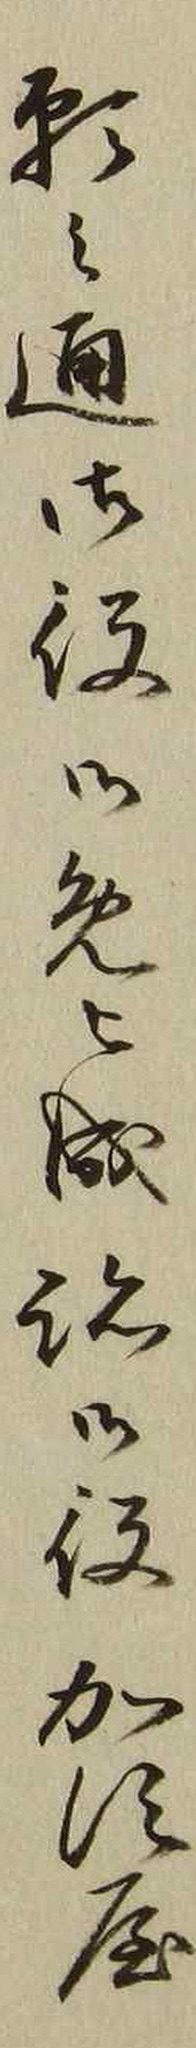願之通御役御免被成跡御役加須屋
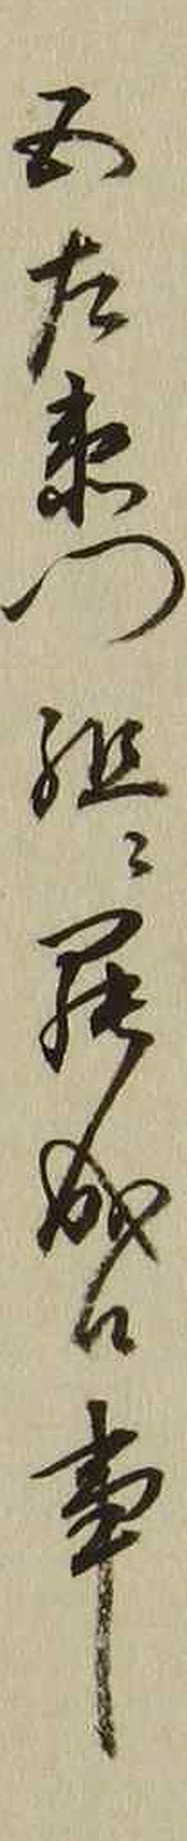五左衛門組ニ罷成候事
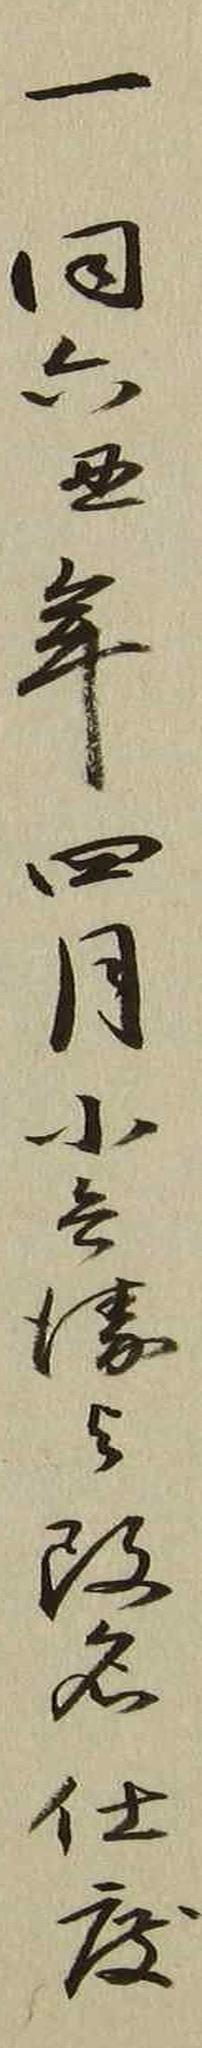一同六丑年四月小兵衛与改名仕度
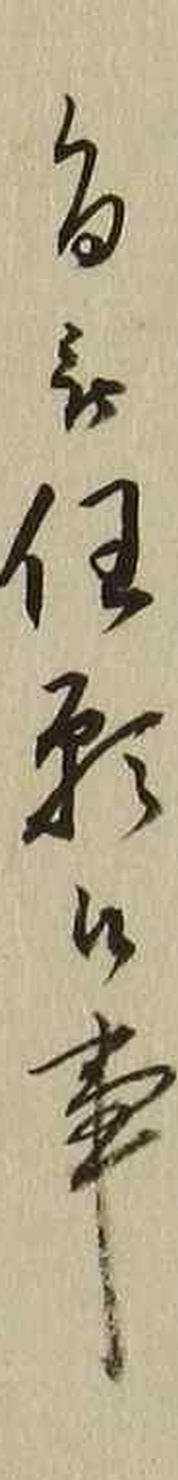旨被任願候事
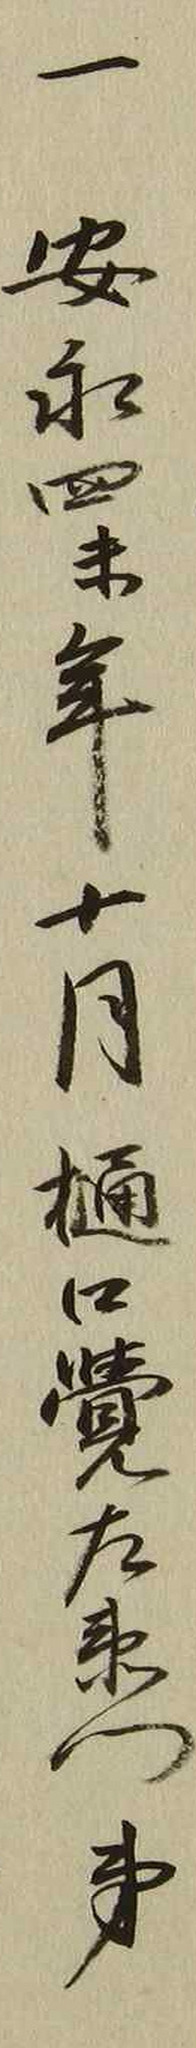一安永四未年十月樋口覚左衛門弟
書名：諸士系譜　巻之128　た之部4
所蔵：会津若松市立会津図書館
